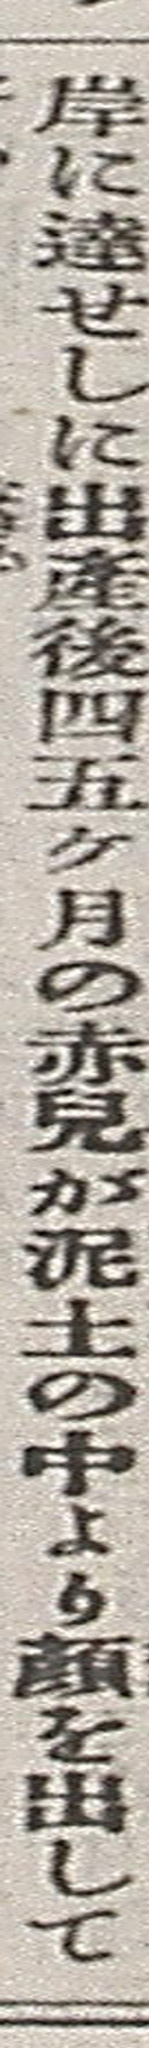岸に達せしに出産後四五ヶ月の赤兒が泥土の中より顔を出して
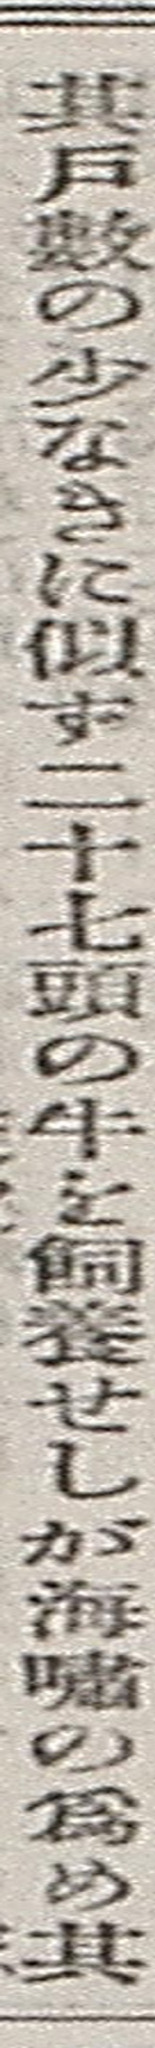其戸数の少なきに似ず二十七頭の牛を飼養せしが海嘯の為め其
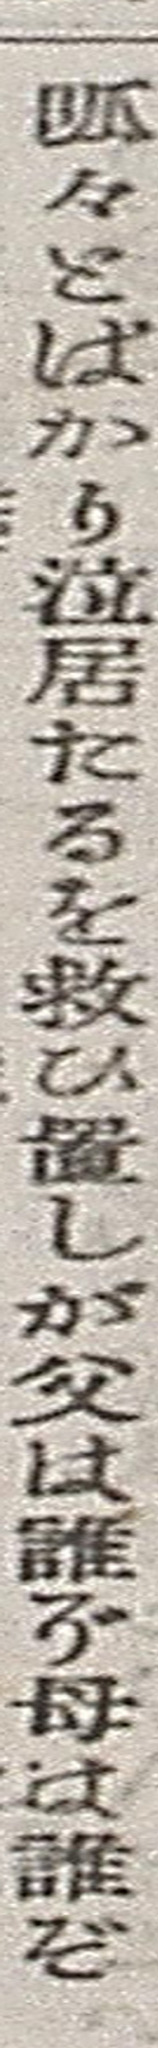呱々とばかり泣居たるを救ひ置しが父は誰ぞ母は誰ぞ
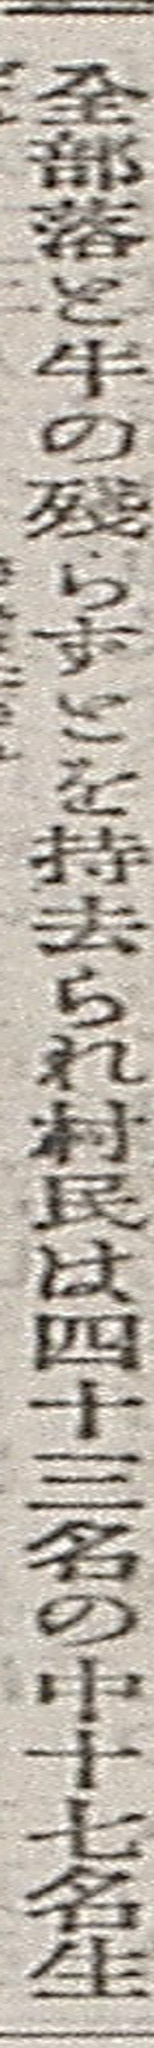全部落と牛の残らずとを持去られ村民は四十三名の中十七名生
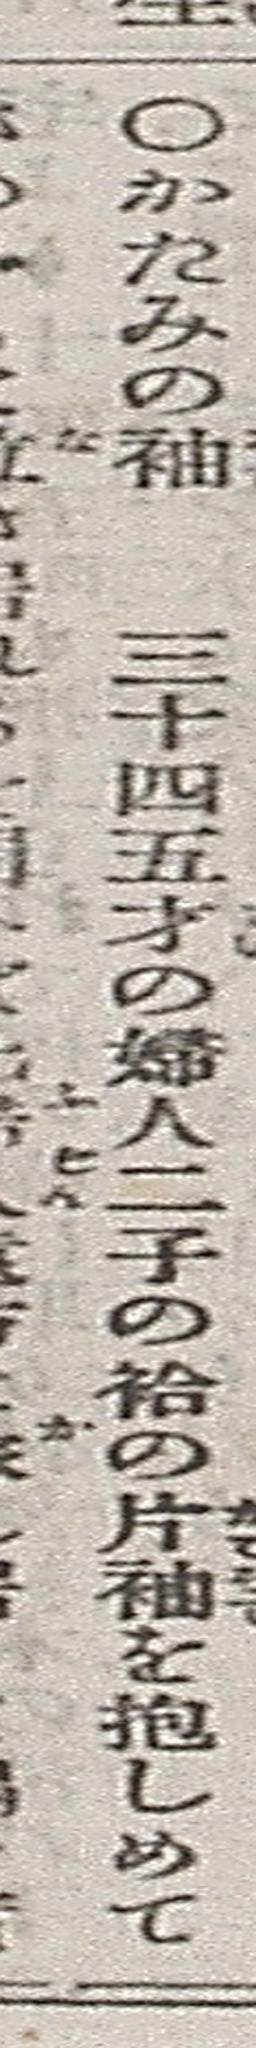○かたみの袖三十四五才の婦人二子の袷の片袖を抱しめて
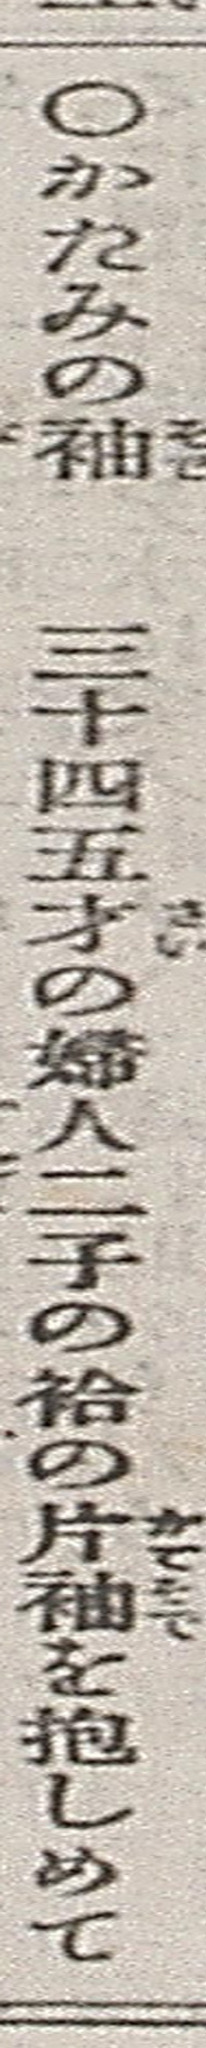○かたみの袖三十四五才の婦人二子の袷の片袖を抱しめて
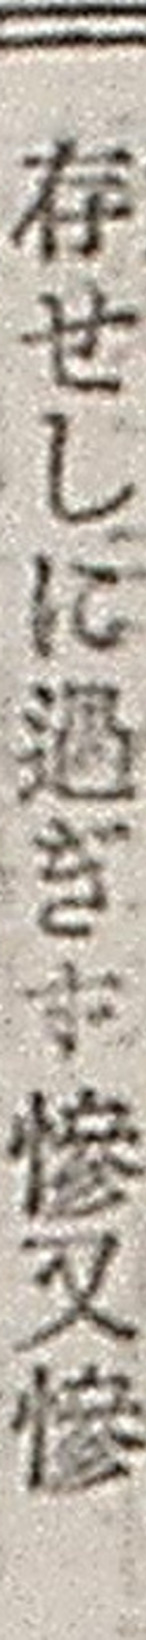存せしに過ぎず惨又惨
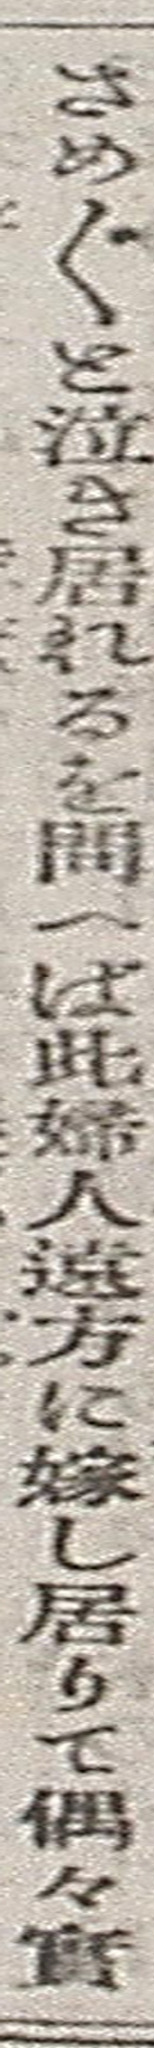さめ〴〵と泣き居れるを問へば此婦人遠方に嫁し居りて偶々実
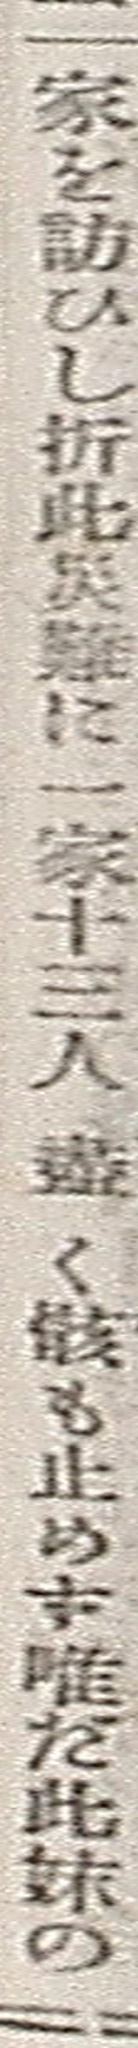家を訪ひし折此災難に一家十三人悉く骸も止めず唯だ此妹の

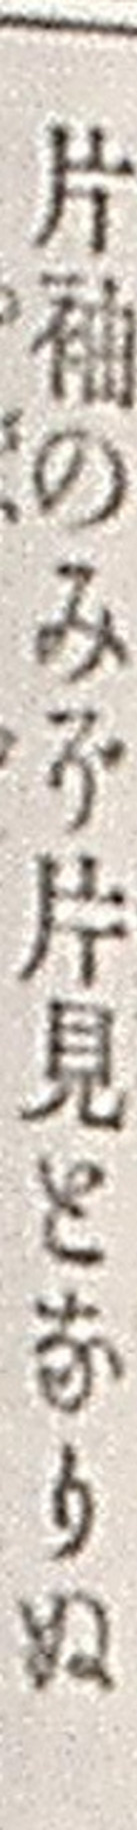片袖のみぞ片見となりぬ
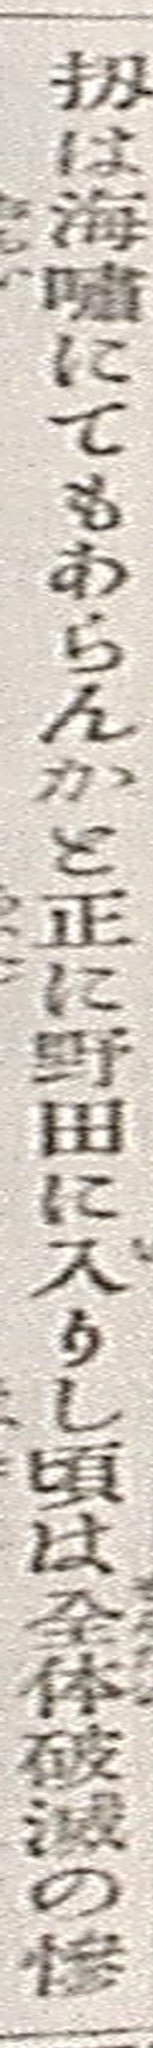扨は海嘯にてもあらんかと正に野田に入りし頃は全体破壊の惨
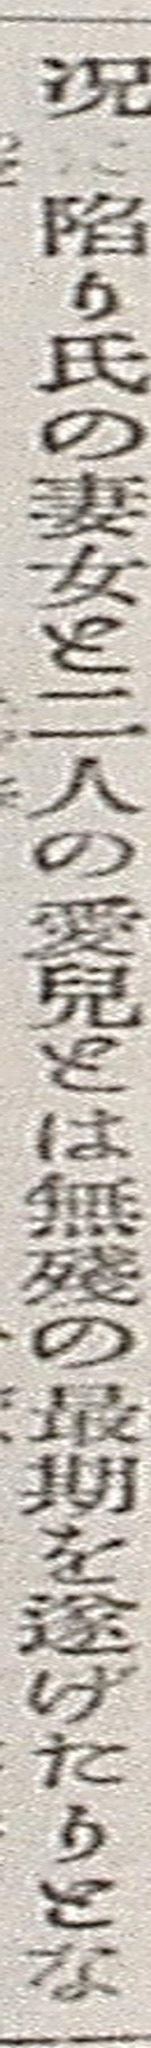況に陥り氏の妻女と二人の愛児とは無残の最期を遂げたりとな
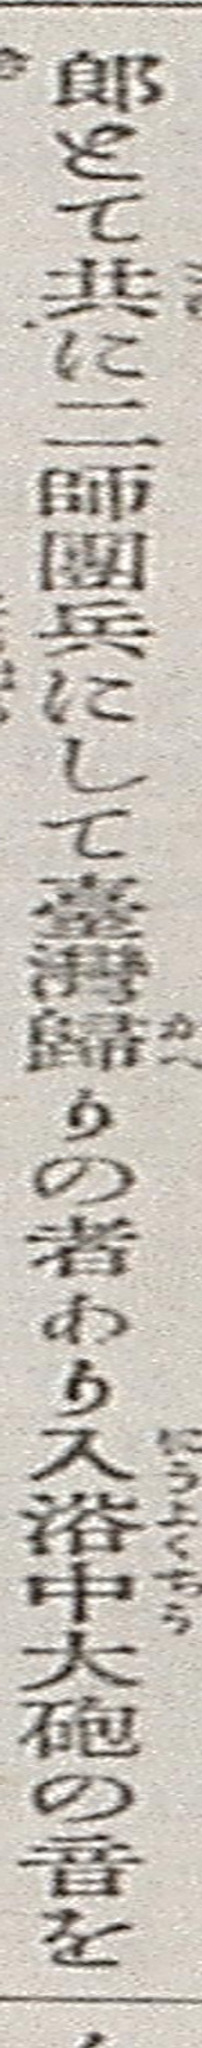郎とて共に二師団兵にして台湾帰りの者あり入浴中大砲の音を
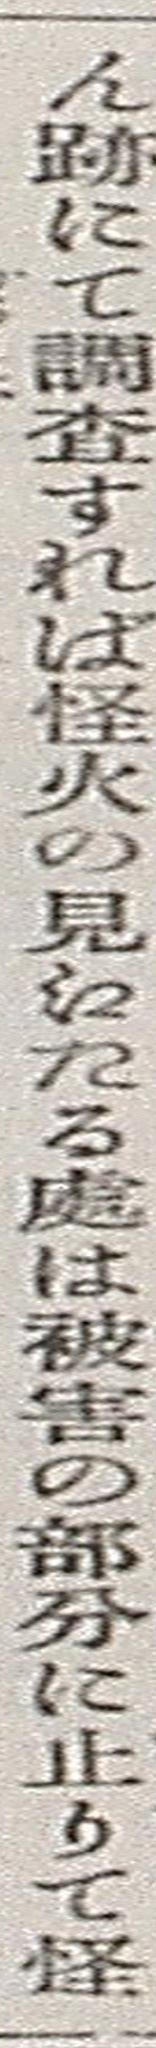ん跡にて調査すれば怪火の見えたる処は被害の部分に止りて怪
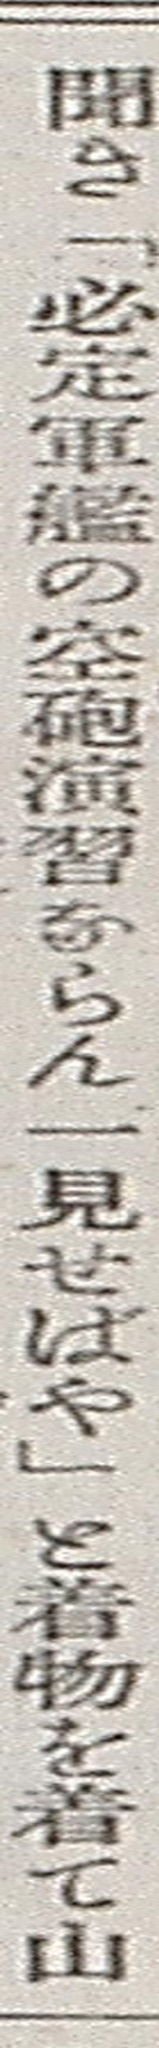聞き「必定軍艦の空砲演習ならん一見せばや」と着物を着て山
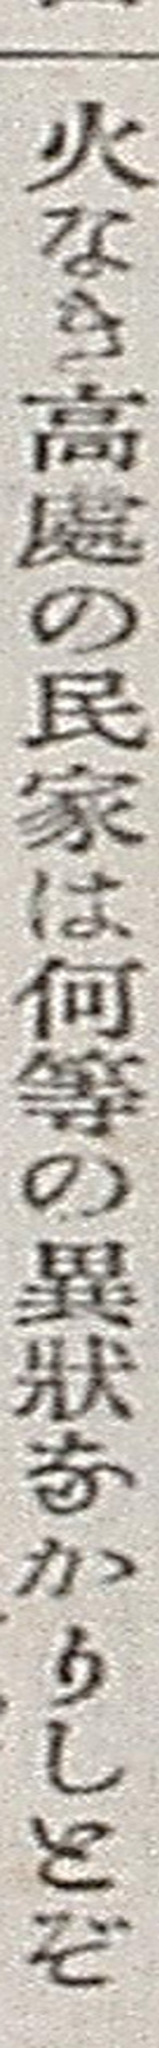火なき高処の民家は何等の異状なかりしとぞ
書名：風俗畫報臨時増刊第百二十號　大海嘯被害録（下）
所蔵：東京大学地震研究所図書室 Earthquake Research Institute Library, The University of Tokyo, JAPAN
